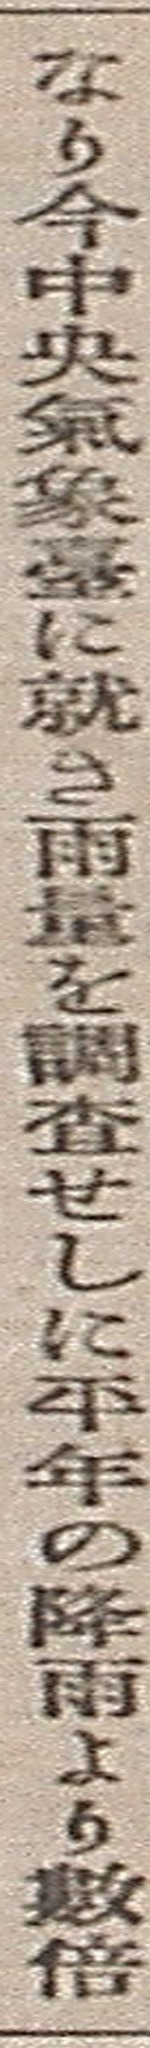なり今中央気象台に就き雨量を調査せしに平年の降雨より数倍
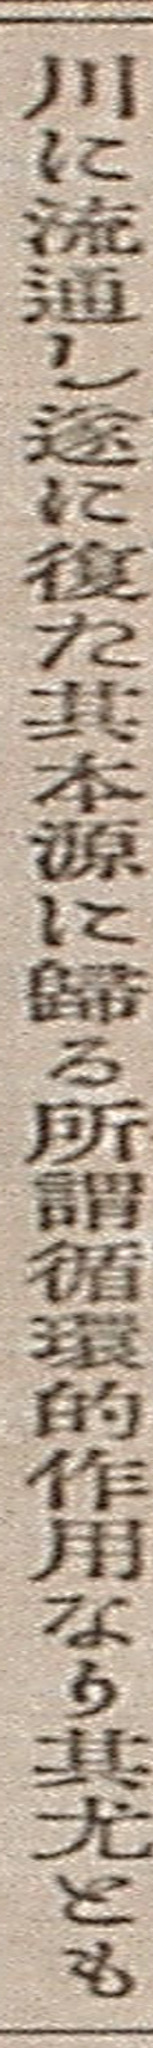川に流通し遂に復た其本源に帰る所謂循環的作用なり其尤とも
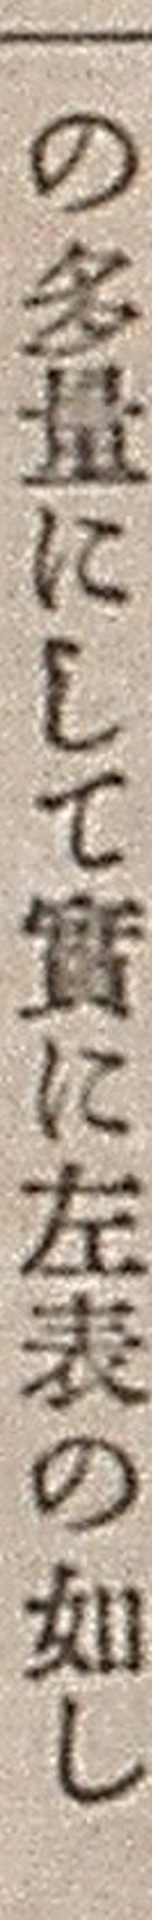の多量にして実に左表の如し
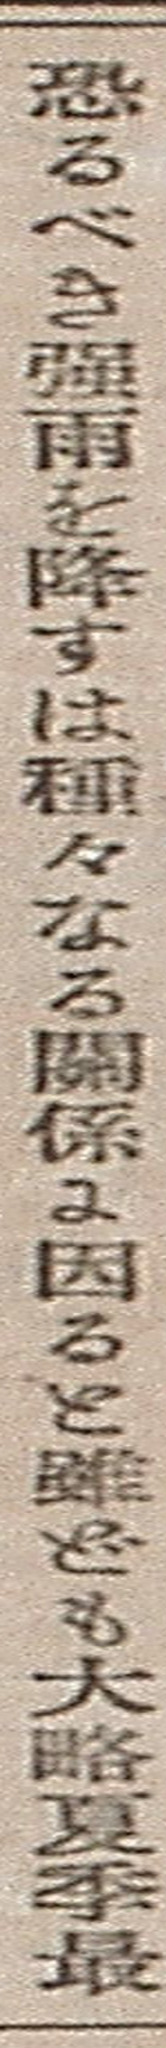恐るべき強雨を降すは種々なる関係に因ると雖ども大略夏季最
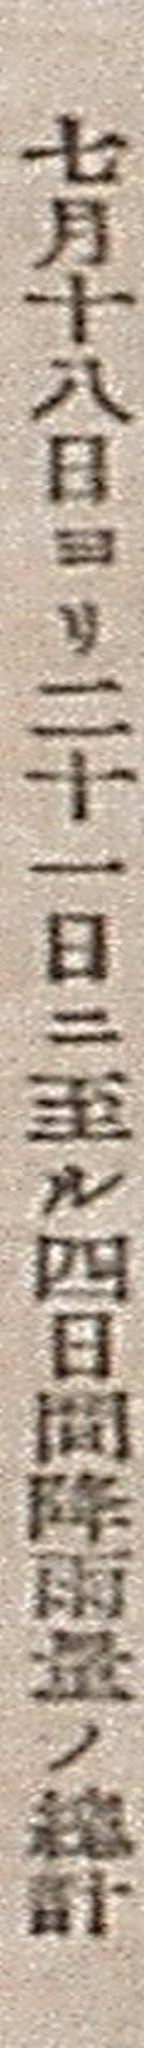七月十八日ヨリ二十一日ニ至ル四日間降雨量ノ総計
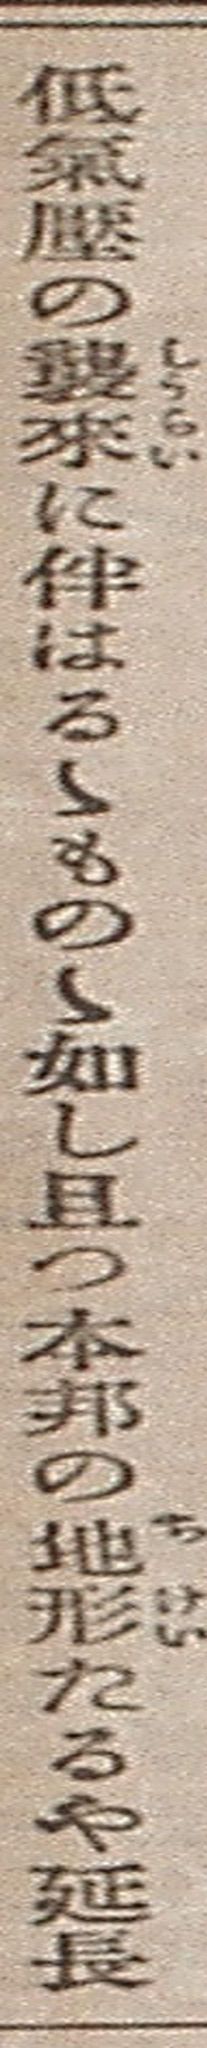低気圧の襲来に伴はるゝものゝ如し且つ本邦の地形たるや延長
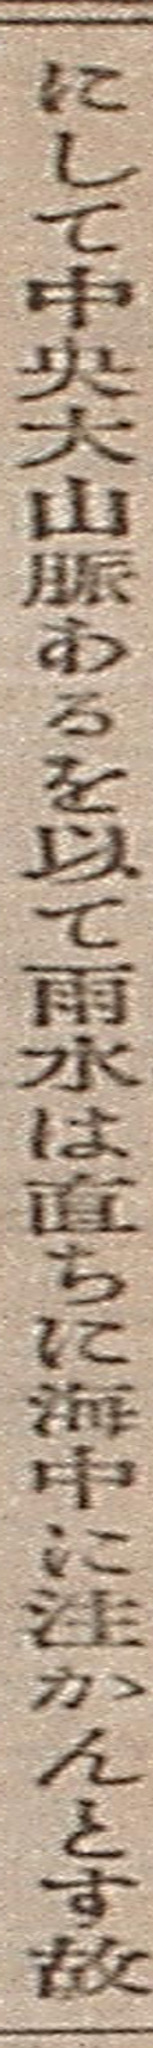にして中央大山脈あるを以て雨水は直ちに海中に注かんとす故
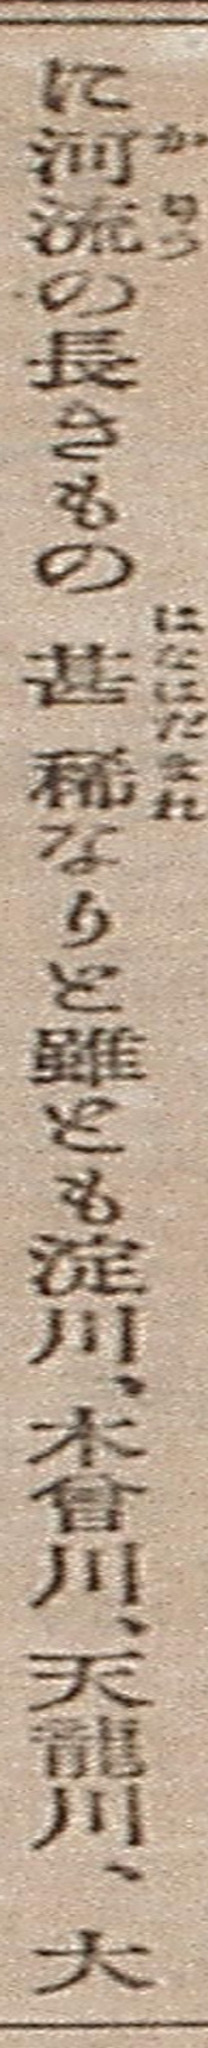に河流の長きもの甚稀なりと雖とも淀川、木曽川、天竜川、大
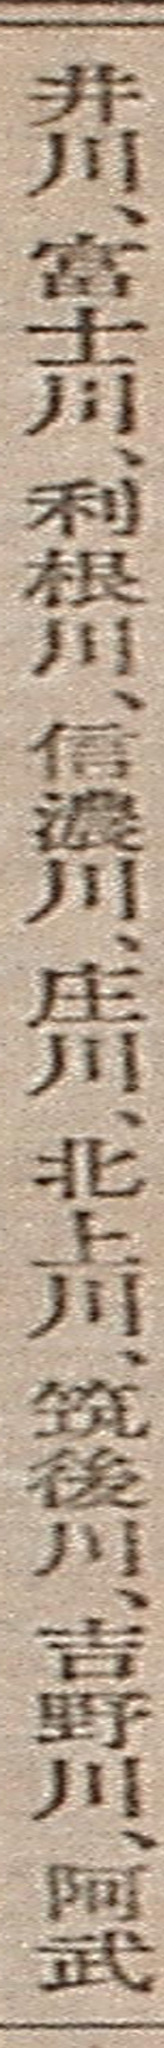井川、富士川、利根川、信濃川、庄川、北上川、筑後川、吉野川、阿武
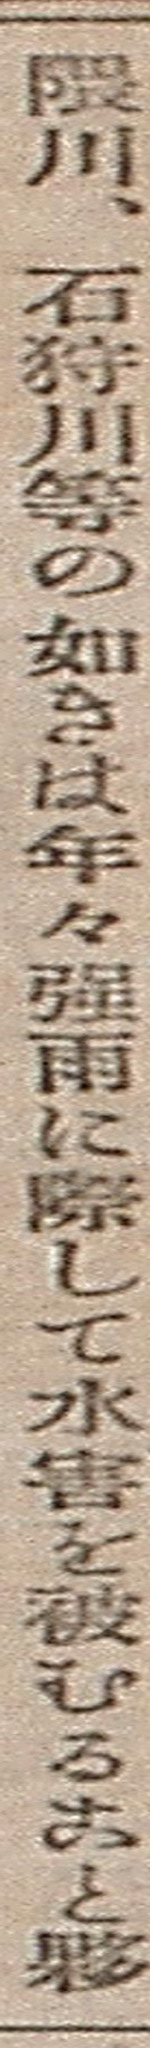隈川、石狩川等の如きは年々強雨に」際して水害を被むること夥
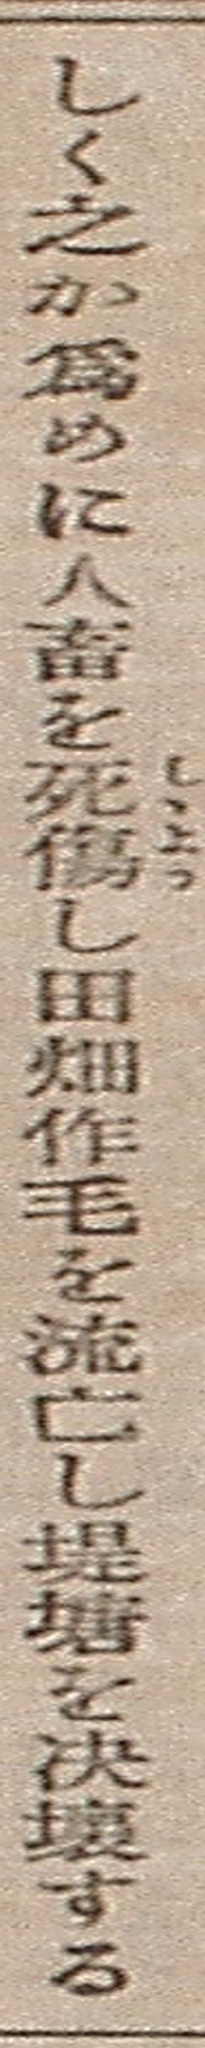しく之か為めに人畜を死傷し田畑作毛を流亡し堤塘を決壊する
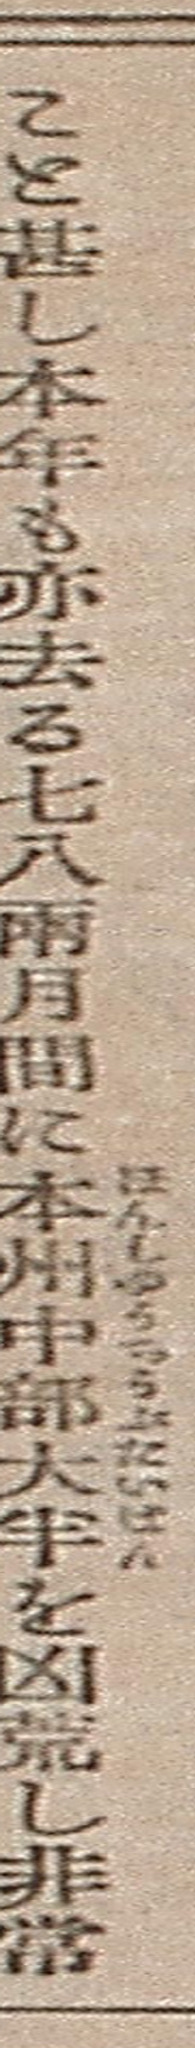こと甚し本年も亦去る七八両月間に本州中部大半を荒し非常
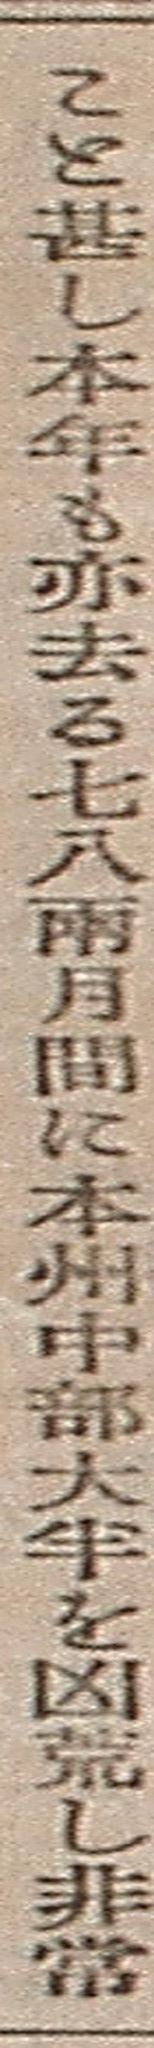こと甚し本年も亦去る七八両月間に本州中部大半を荒し非常
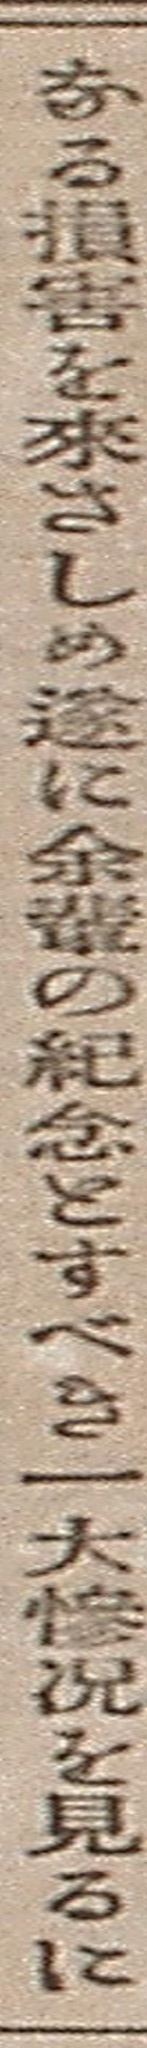なる損害を来さしめ遂に余輩の紀念とすべき一大惨況を見るに
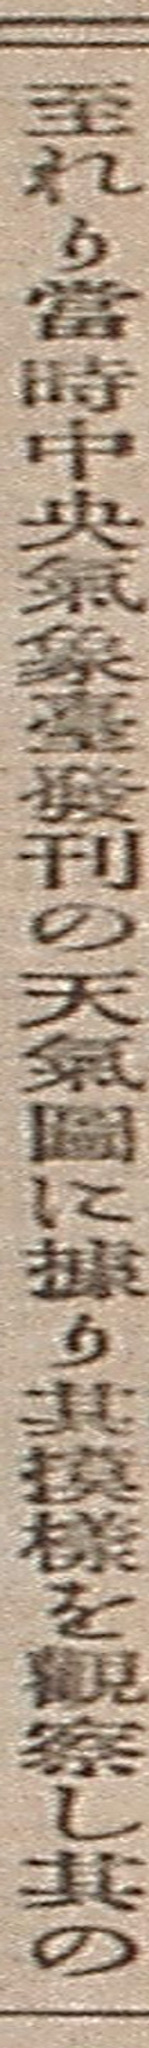至れり当時中央気象台発刊の天気図に拠り其模様を観察し其の
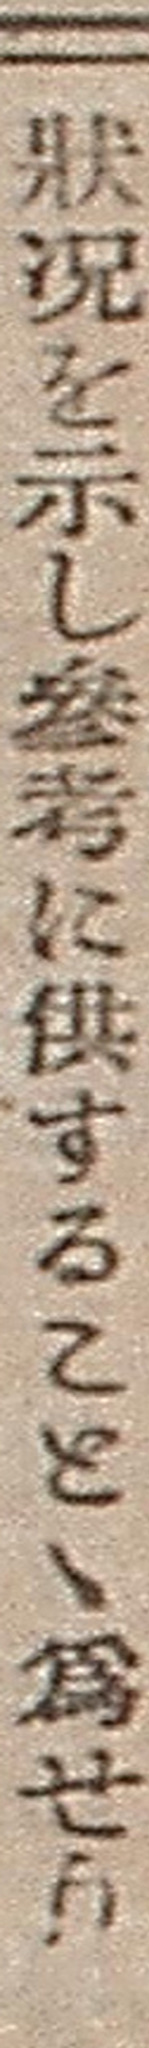状況を示し参考に供することゝ為せり
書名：風俗畫報臨時増刊第百二十四號　洪水地震被害録（上）
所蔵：東京大学地震研究所図書室 Earthquake Research Institute Library, The University of Tokyo, JAPAN
